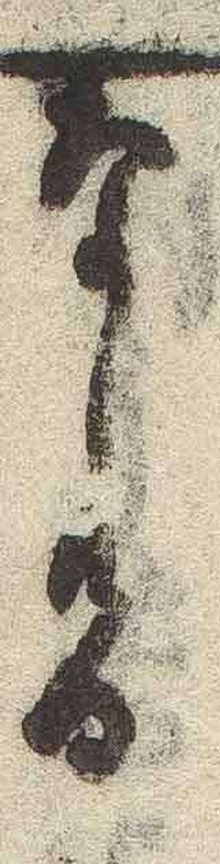なしける
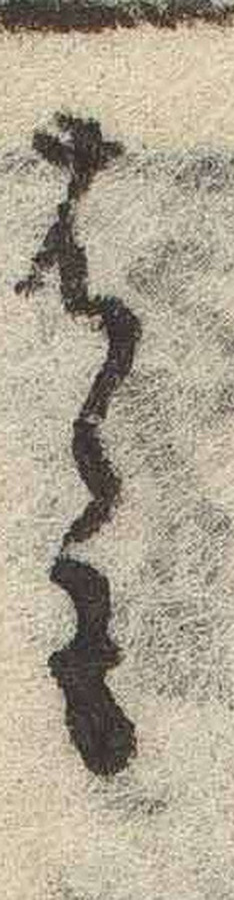はゝも
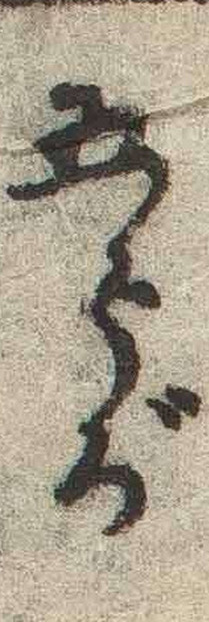五郎が
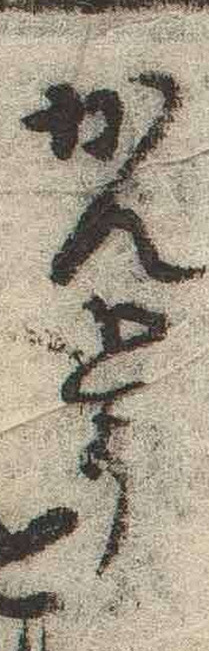かんとうを
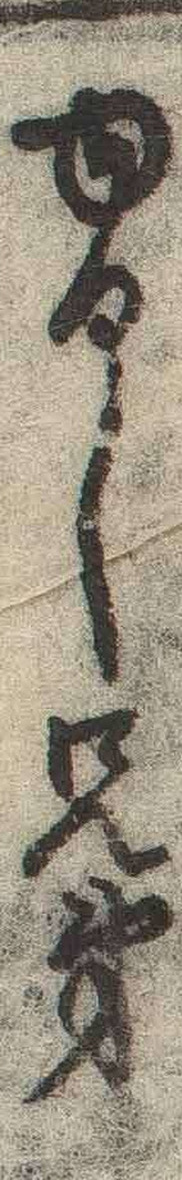ゆるし兄弟
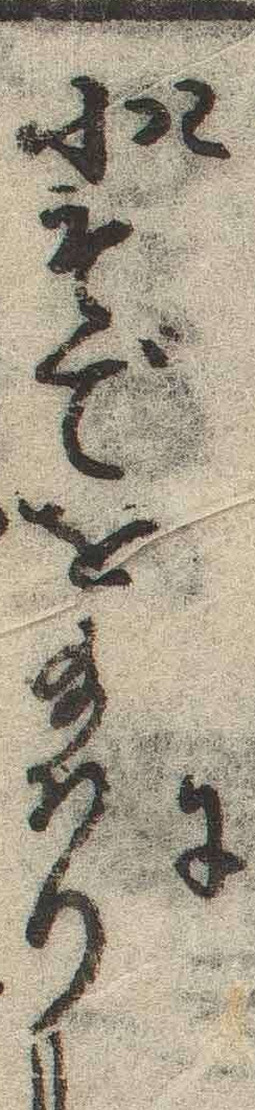小そでを給はり
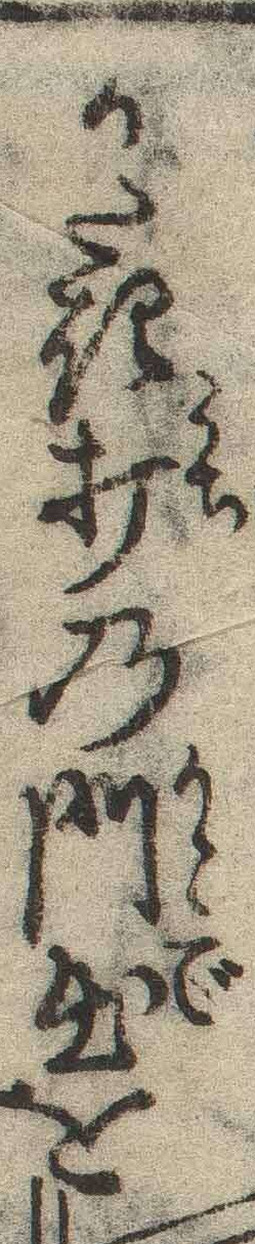かたき打の門出を
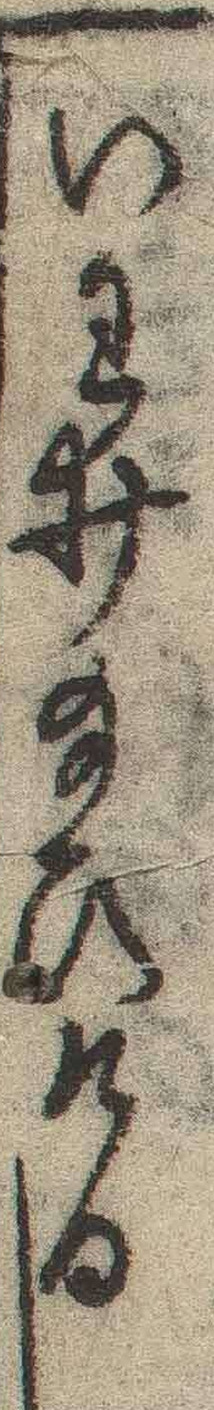いわゐ給ひける

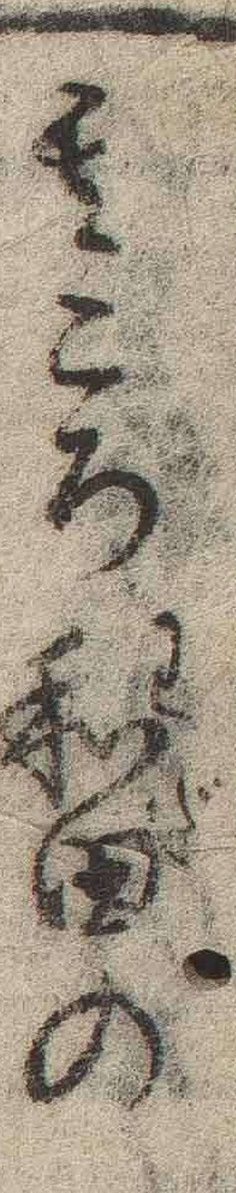其ころ和田の
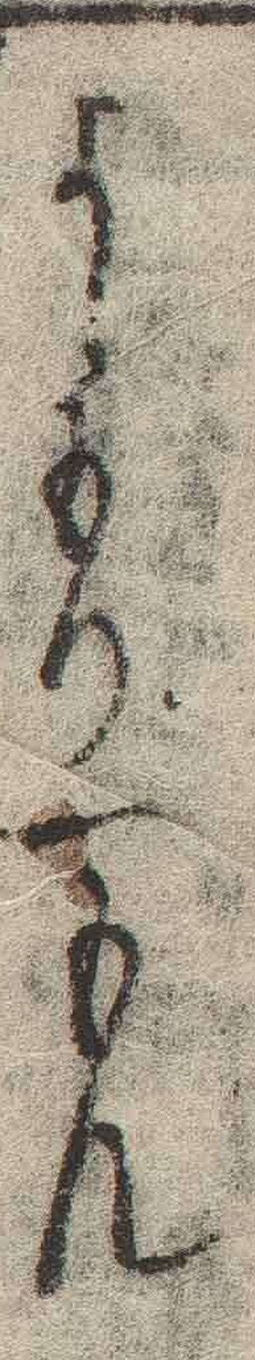よしもり一もん
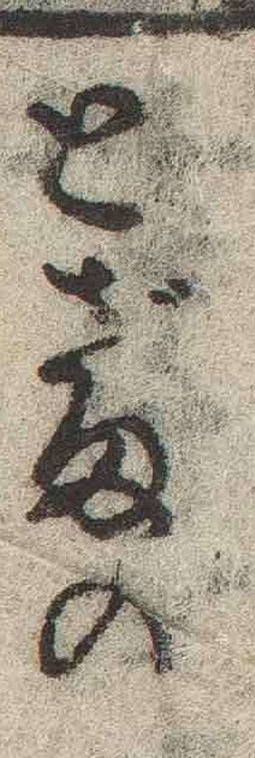とざまの
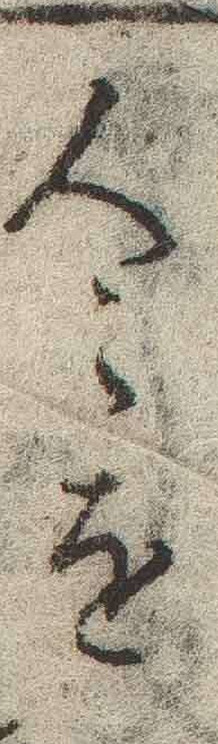人々を
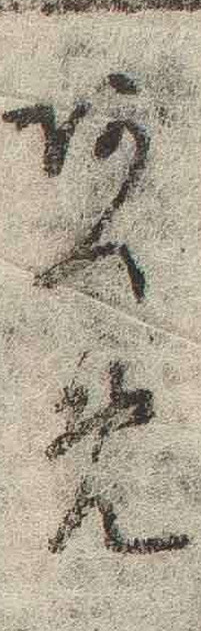あつめ
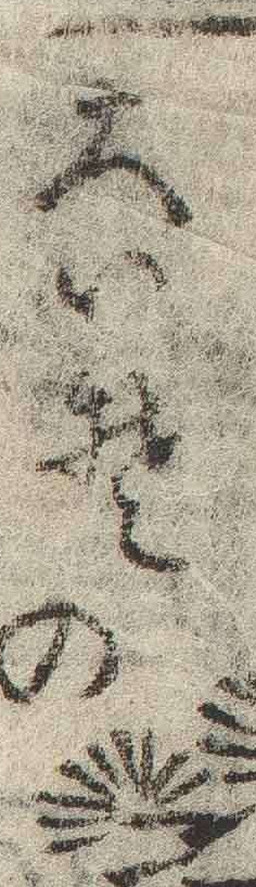大いその
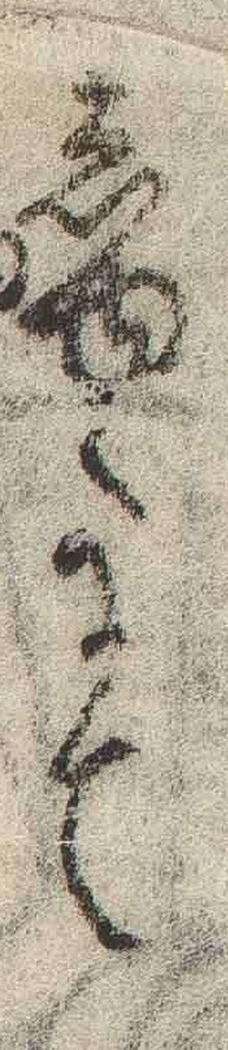しゆくにて
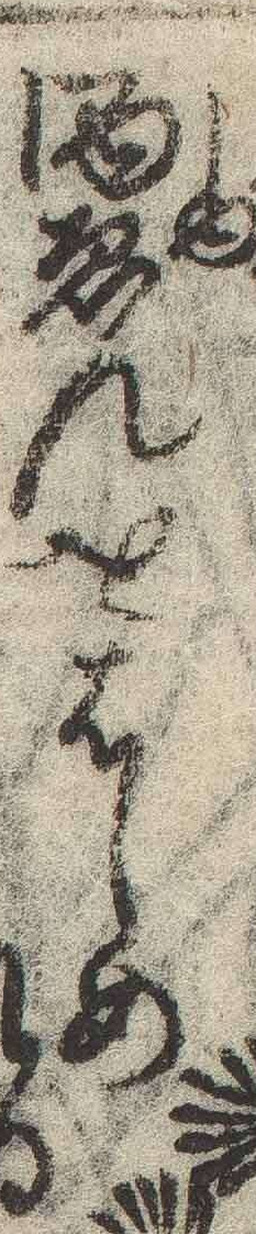酒ゑんをはしめ
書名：末広扇
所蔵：東京学芸大学附属図書館 国文学研究資料館
